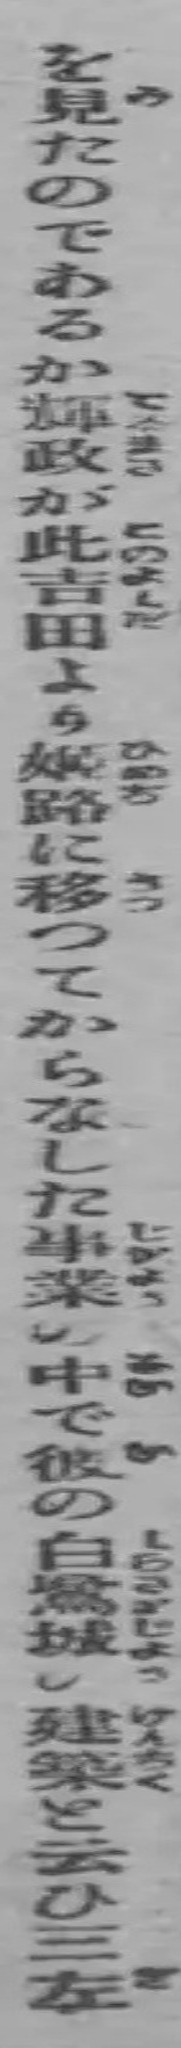を見たのであるか輝政が此吉田より姫路に移つてからなした事業の中で彼の白鷺城の建築と云ひ三左
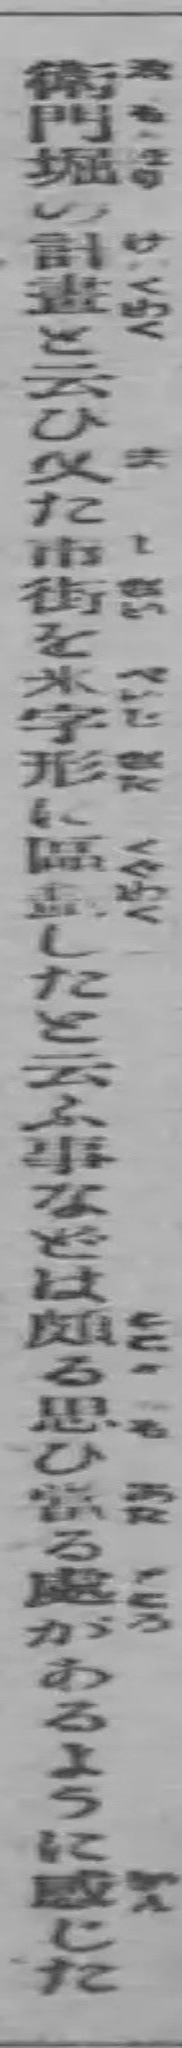衛門堀の計画と云ひ又た市街を米字形に区画したと云ふ事などは頗る思ひ当る処があるように感じた
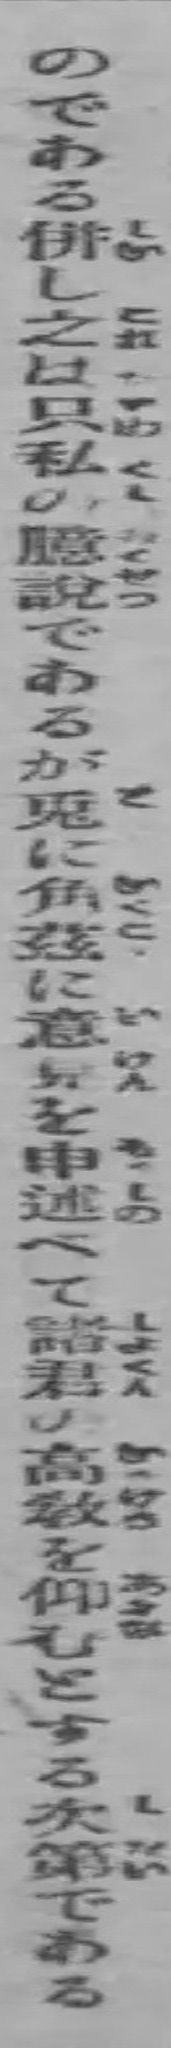のである併し之は只私の臆説であるが兎に角茲に意見を申述べて諸君の高教を仰むとする次第である
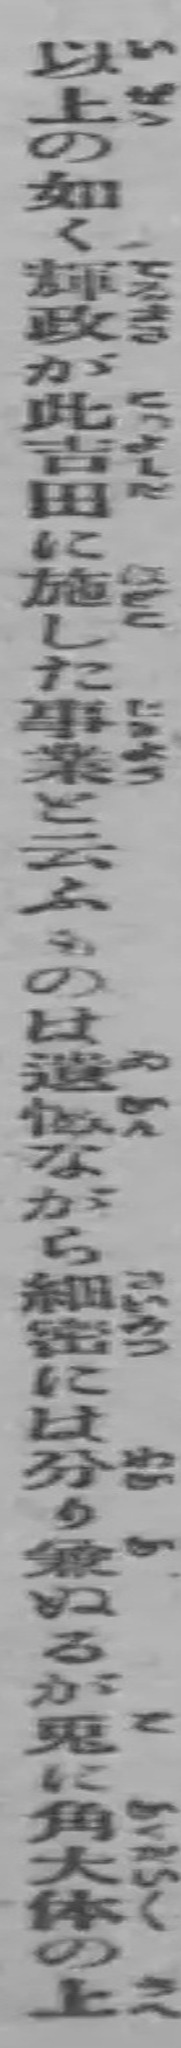以上の如く輝政が此吉田に施した事業と云ふものは遺憾ながら細密には分り兼ぬるが兎に角大体の上
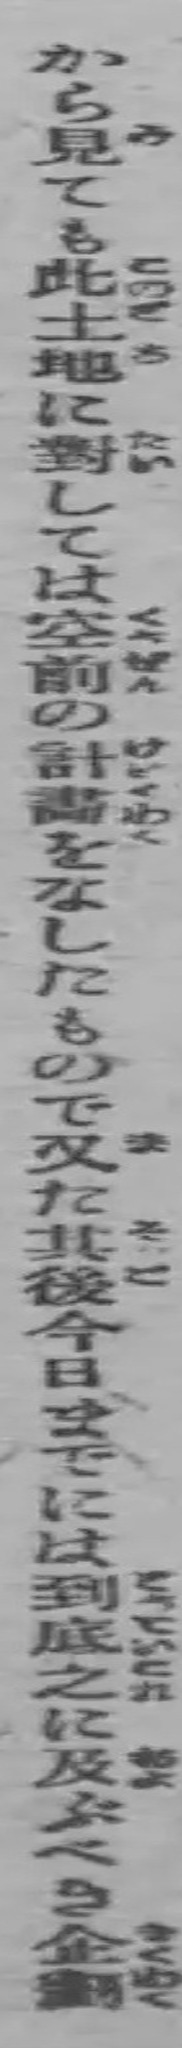から見ても此土地に対しては空前の計画をなしたもので又た其後今日までには到底之に及ぶべき企画
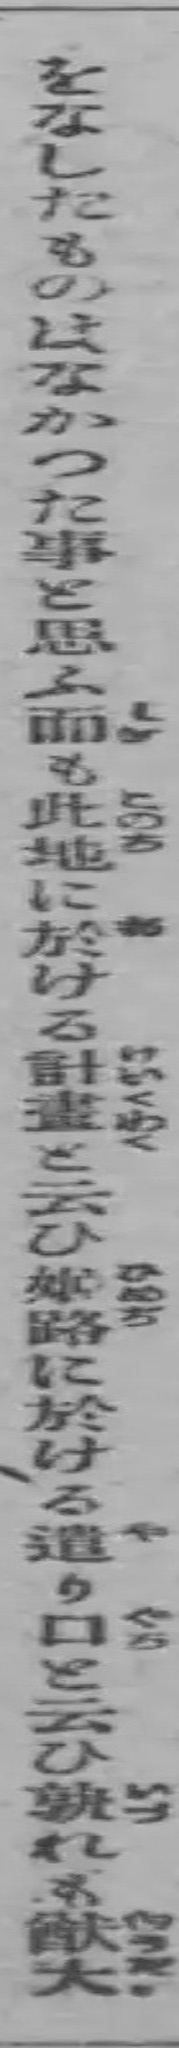をなしたものはなかつた事と思ふ而も此地に於ける計画と云ひ姫路に於ける遣り口と云ひ孰れも猷大
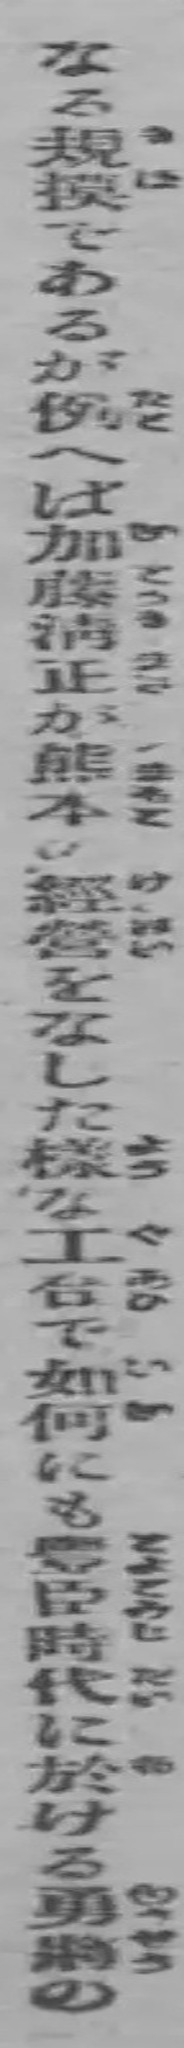なる規模であるが例へば加藤清正が熊本の経営をなした様な工合で如何にも豊臣時代於ける勇将の
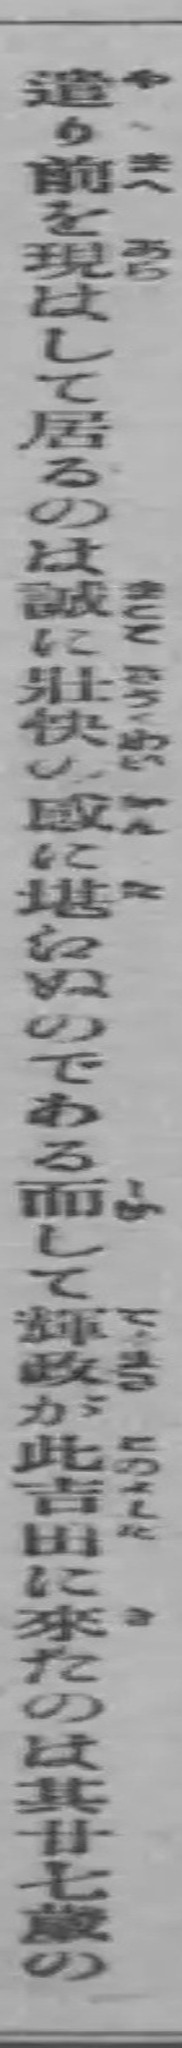遣り前を現はして居るのは誠に壮快の感に堪えぬのである而して輝政が此吉田に来たのは其廿七歳の
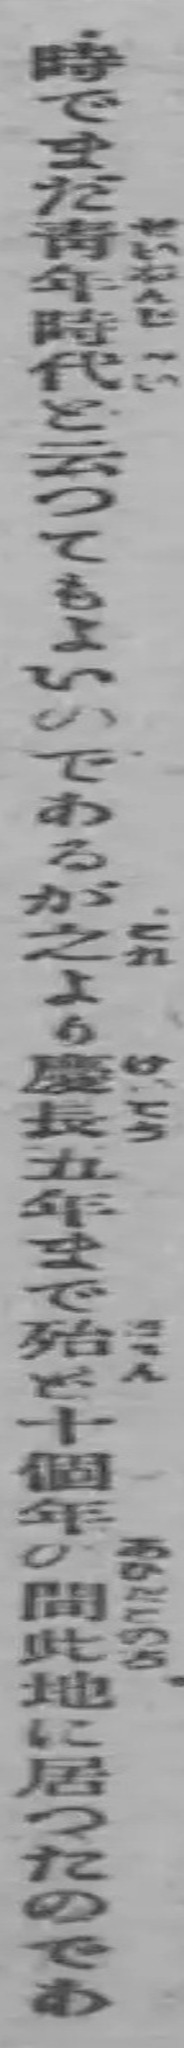時でまだ青年時代と云つてもよいのであるが之より慶長五年まで殆ど十個年の間此地に居つたのであ
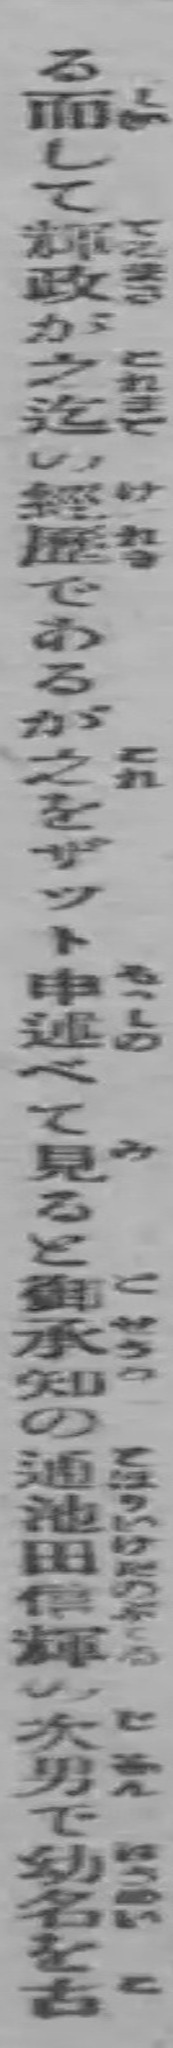輝政の略歴る而して輝政が之迄の経歴であるが之をザツト申述べて見ると御承知の通池田信輝の次男で幼名を古
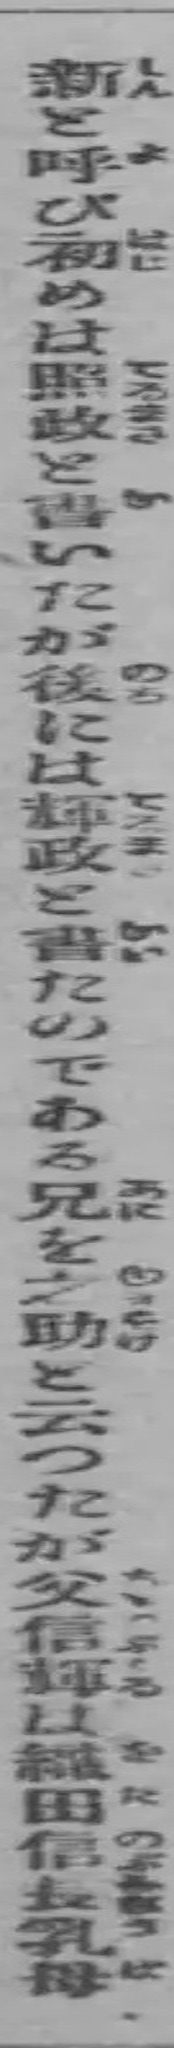新と呼び初めは照政と書いたが後には輝政と書たのである兄を之助と云つたが父信輝は織田信長乳母
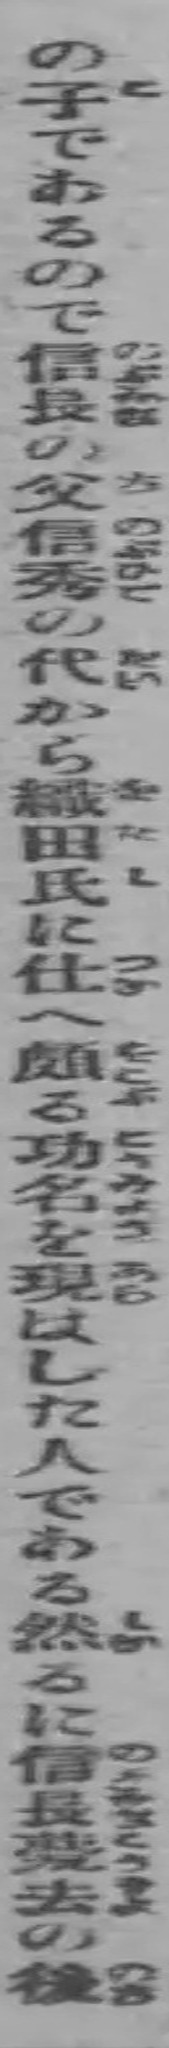の子であるので信長の父信秀の代から織田氏に仕へ頗る功名を現はした人である然るに信長薨去の後

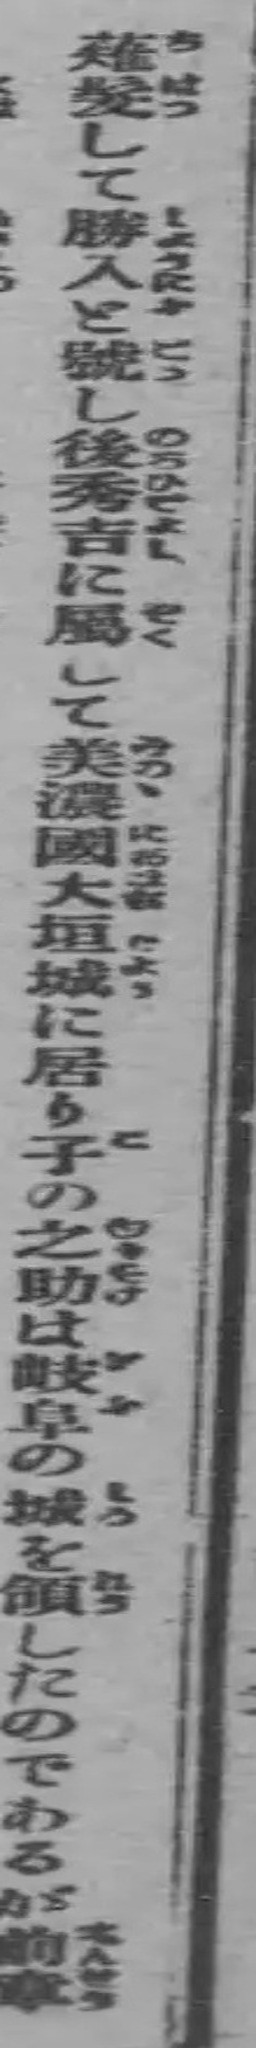薙髪して勝入と号し後秀吉に属して美濃国大垣城に居り子の之助は岐阜の城を領したのであるが前章
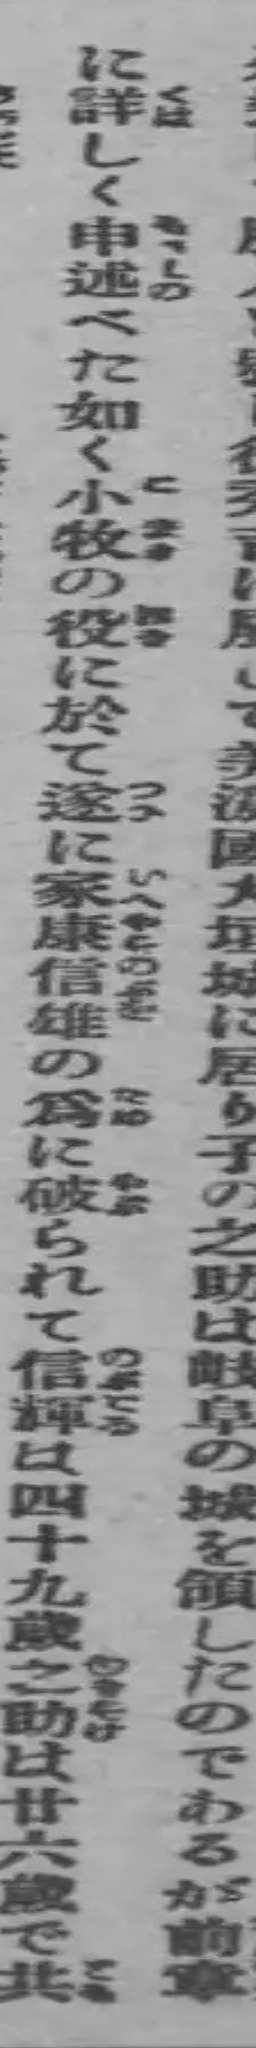に詳しく申述べた如く小牧の役に於て遂に家康信雄の為に破られて信輝は四十九歳之助は廿六歳で共
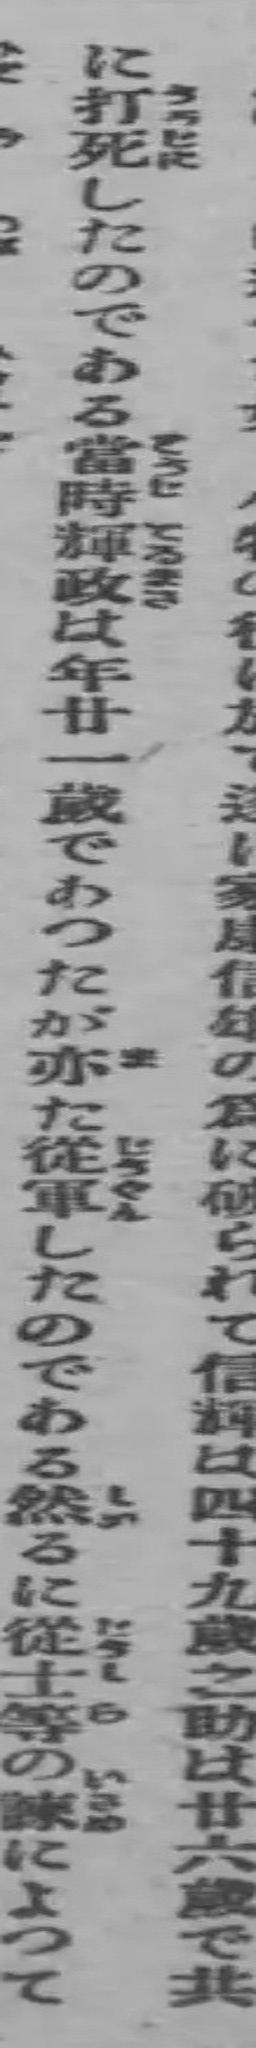に打死したのである当時輝政は年廿一歳であつたが亦た従軍したのである然るに従士等の諌によつて
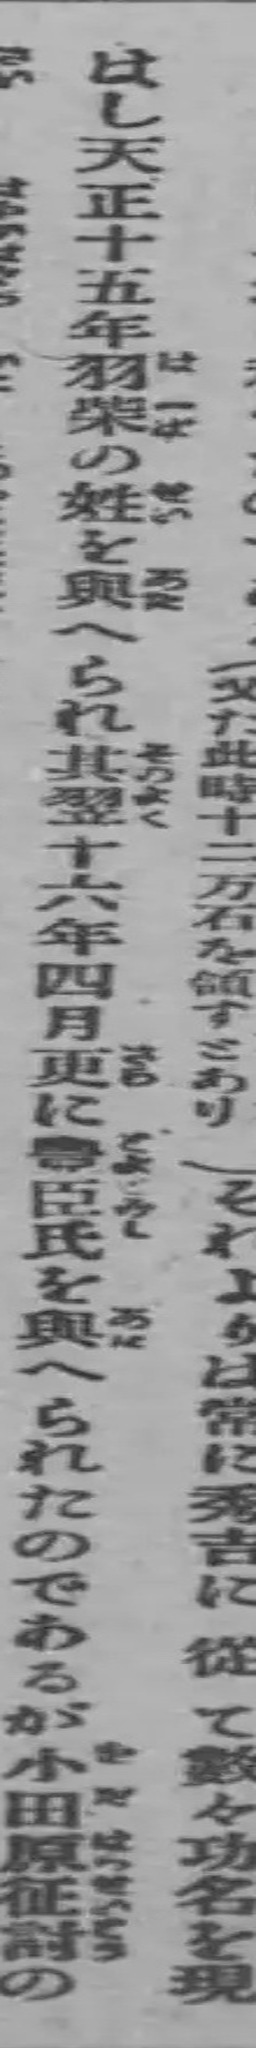はし天正十五年羽柴の姓を与へられ其翌十六年四月更に豊臣氏を与へられたのであるが小田原征討の
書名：豊橋市史談
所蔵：国立国会図書館 National Diet Library, JAPAN
